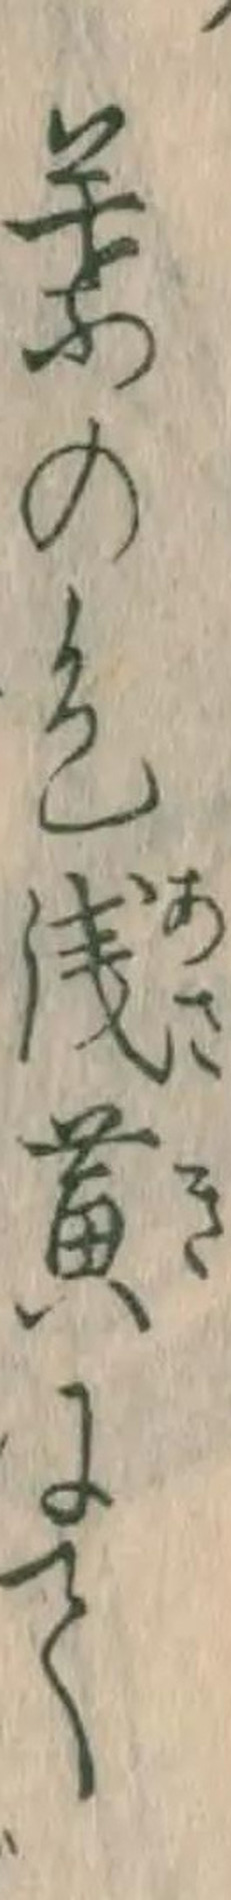葉の色浅黄にて
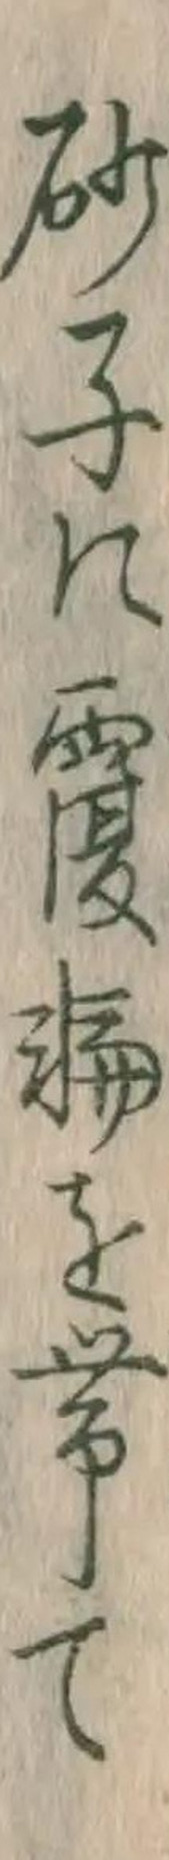砂子に覆輪を帯て
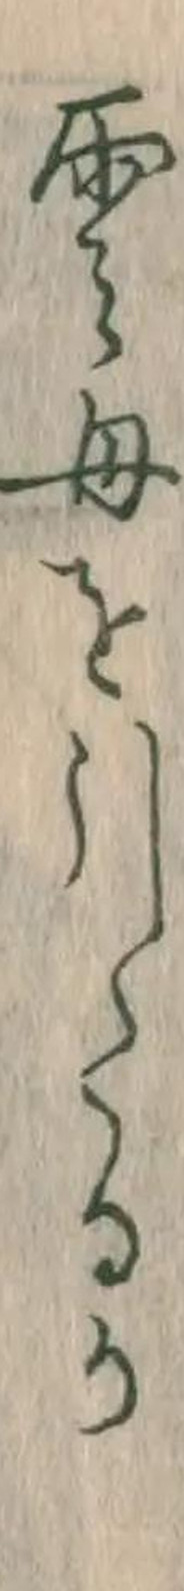雲母を引たるか
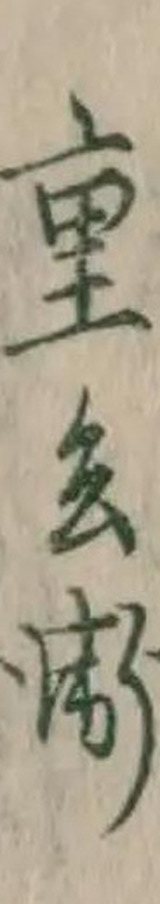重兵衛
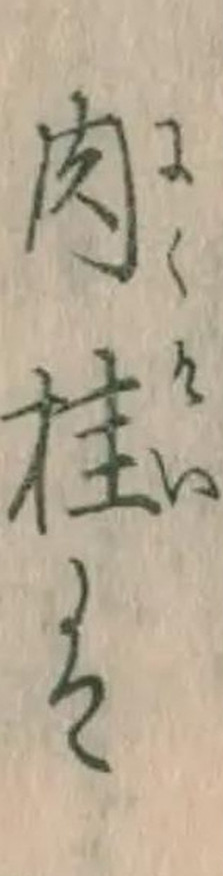肉桂は
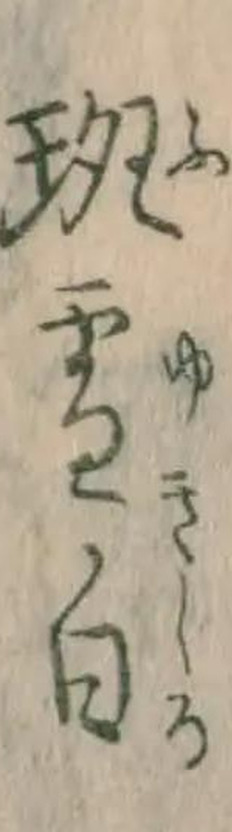斑雪白
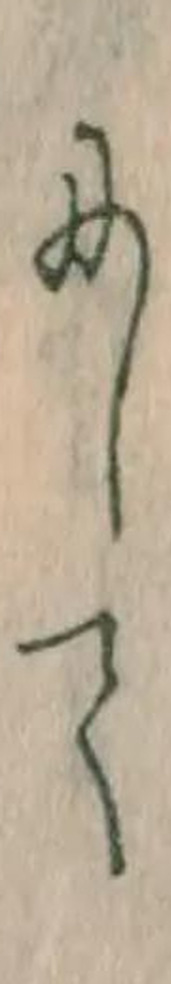にして
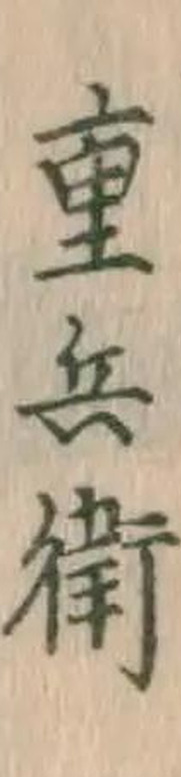重兵衛
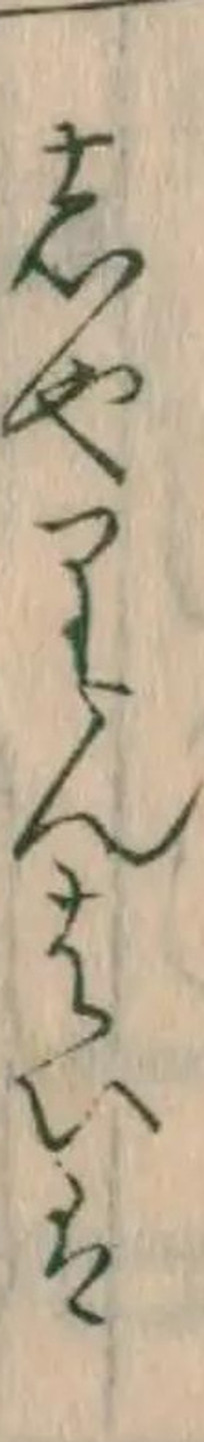しやりんはいは
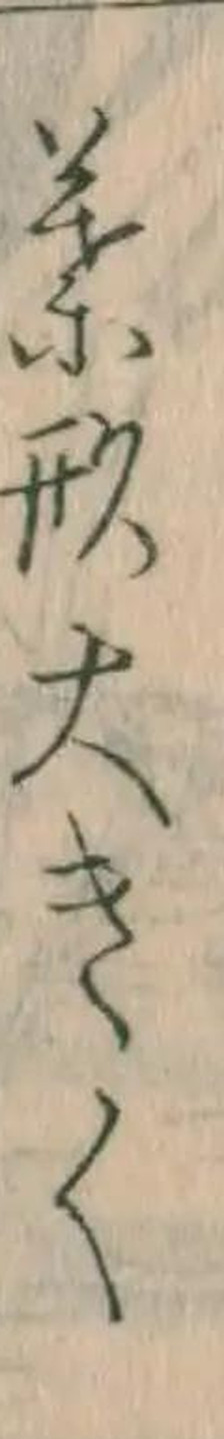葉形大きく
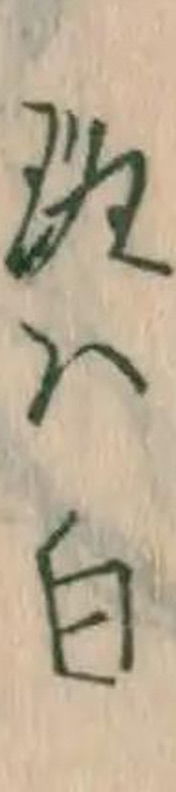斑は白
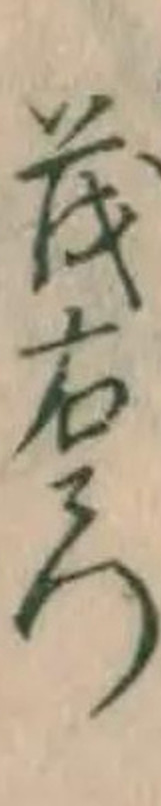茂右衛門
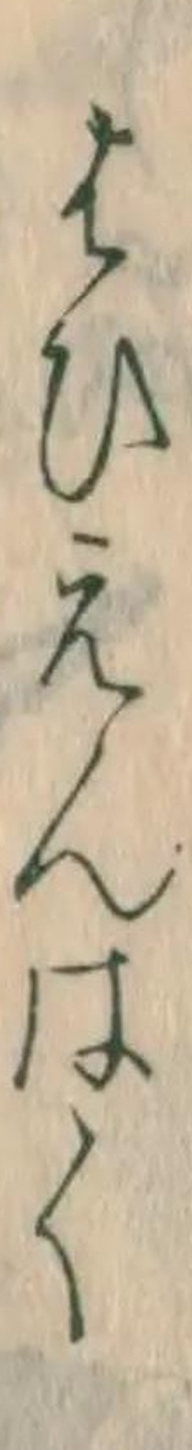はひえんはく
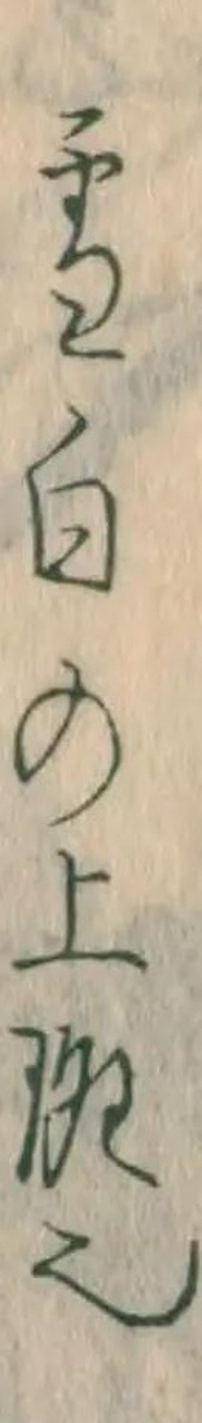雪白の上斑也
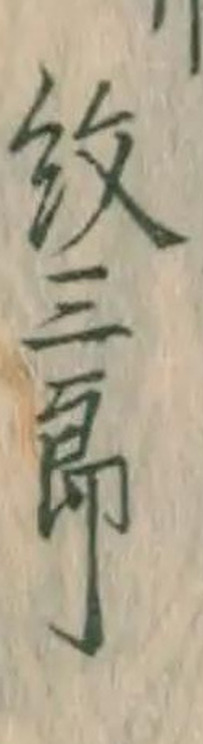紋三郎

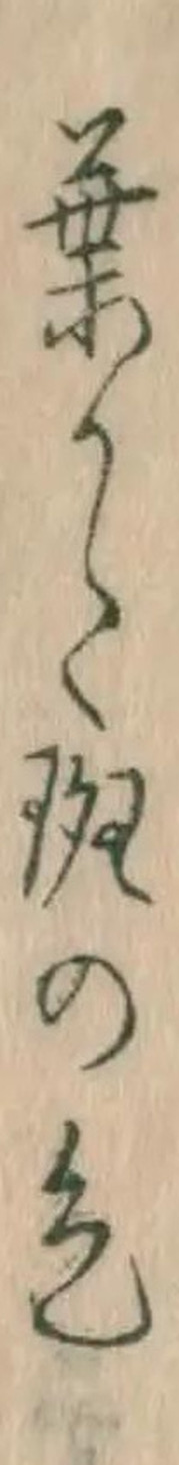葉かた斑の色
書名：草木奇品家雅見 3巻. [3]
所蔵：国立国会図書館 National Diet Library, JAPAN
